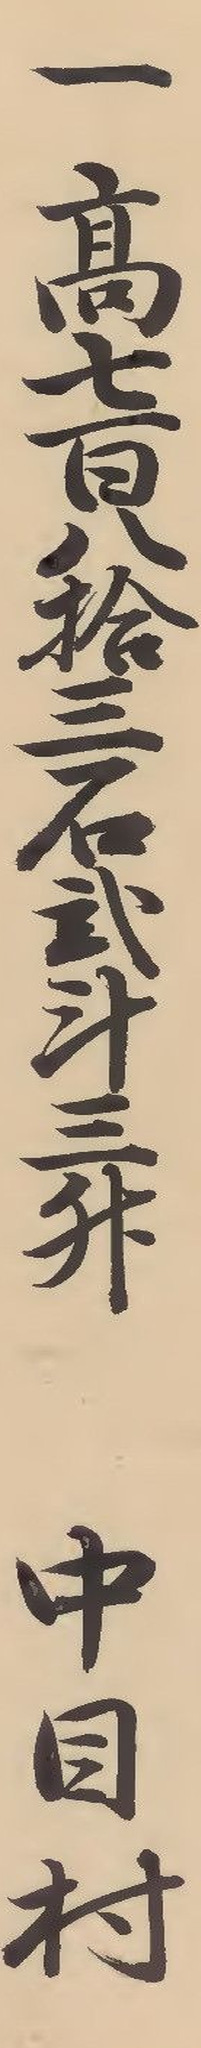一高七百八拾三石弐斗三升中目村
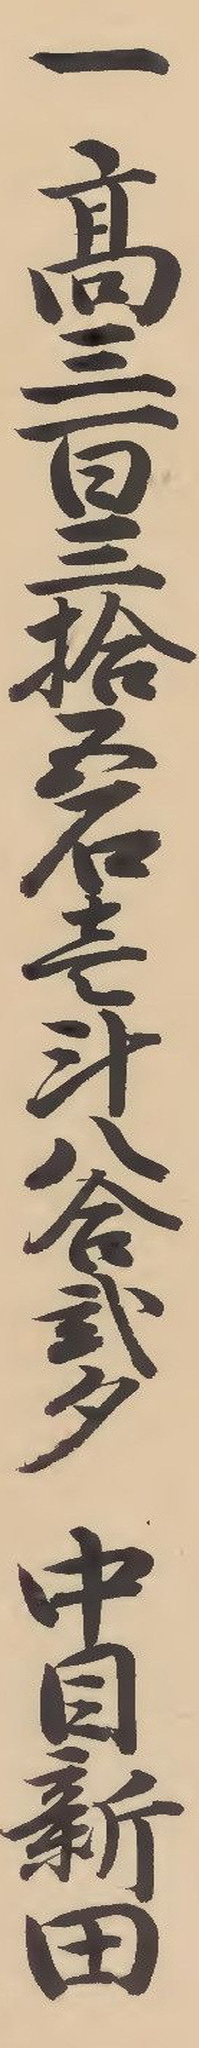一高三百三拾五石壱斗八合弐勺中目新田

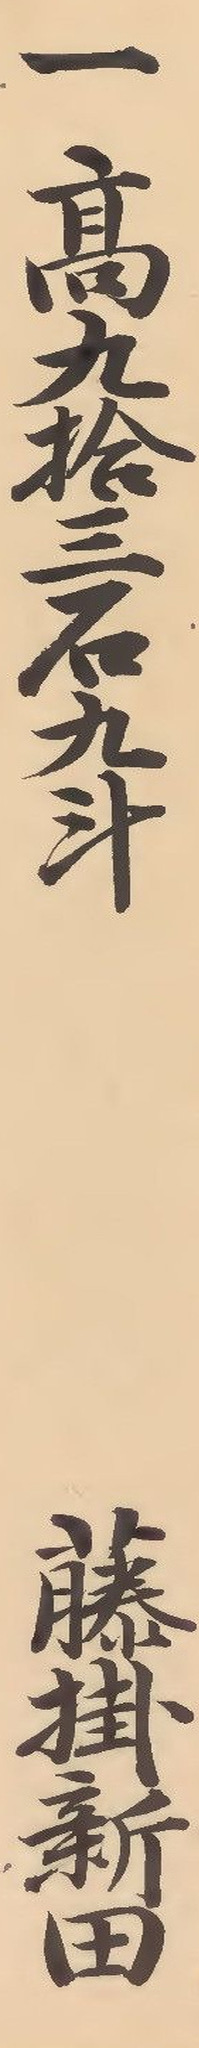一高九拾三石九斗藤掛新田
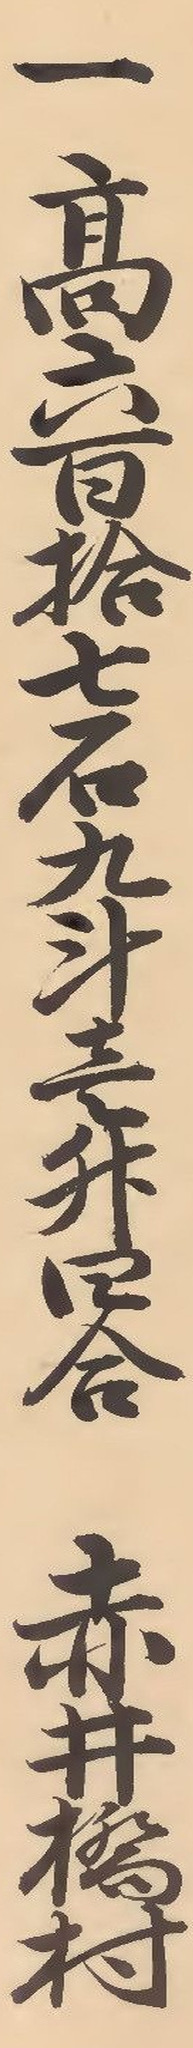一高六百拾七石九斗壱升四合赤井橋村
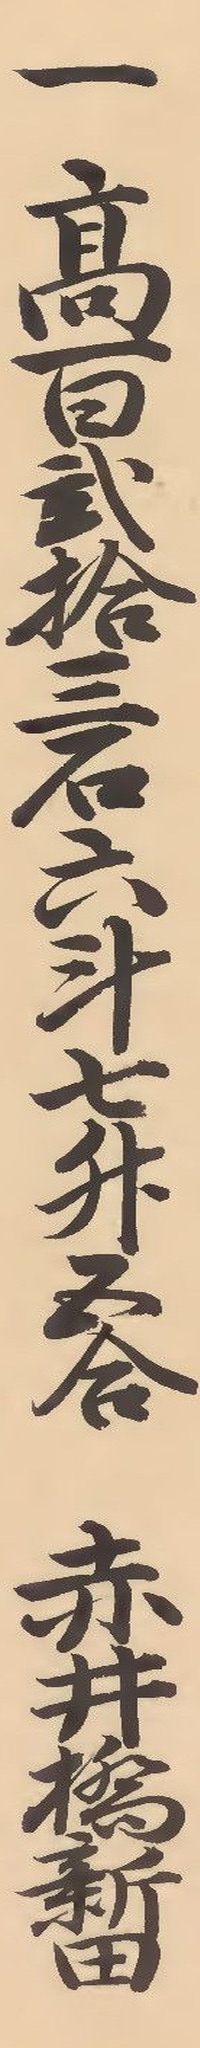一高百弐拾三石六斗七升五合赤井橋新田
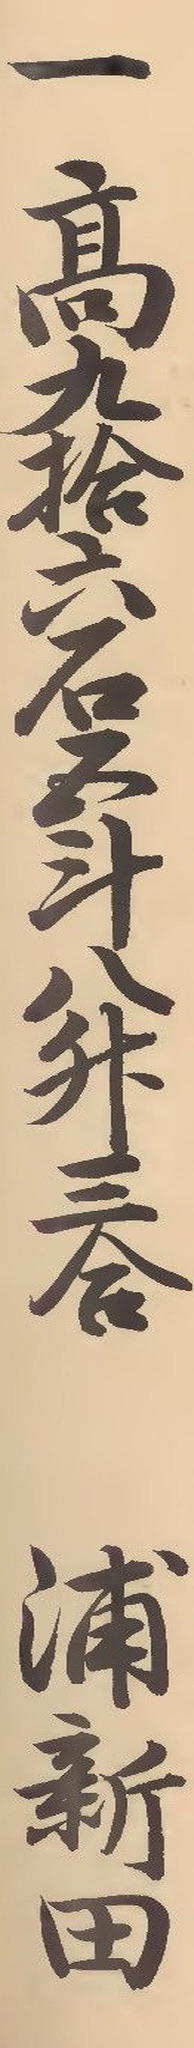一高九拾六石五斗八升三合浦新田
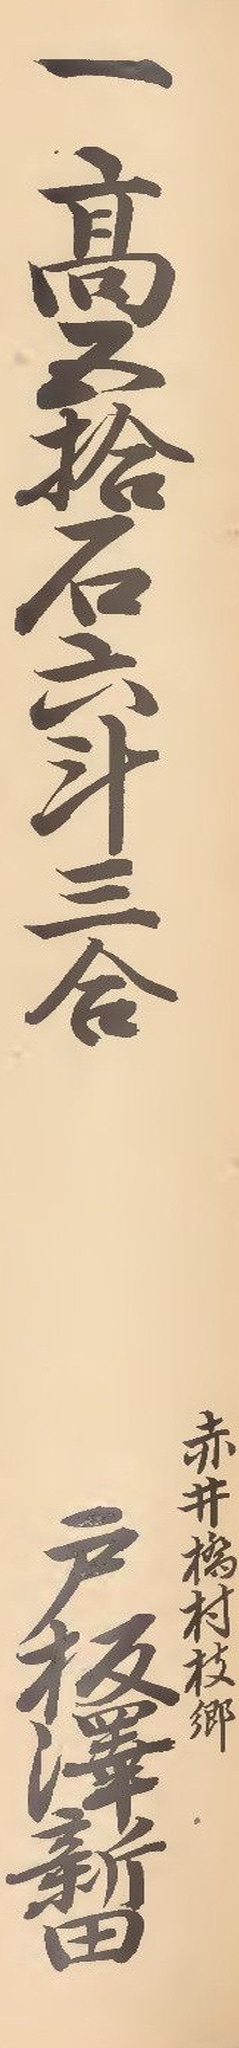一高五拾石六斗三合戸板沢新田
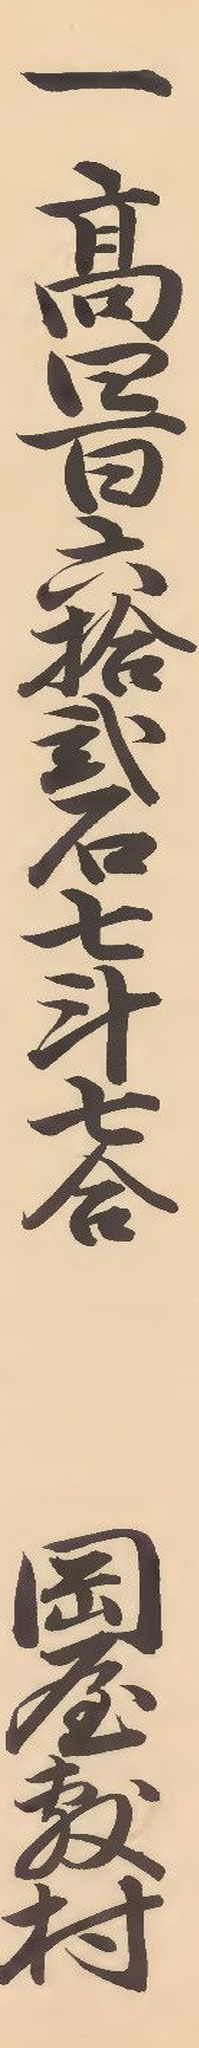一高四百六拾弐石七斗七合岡屋敷村
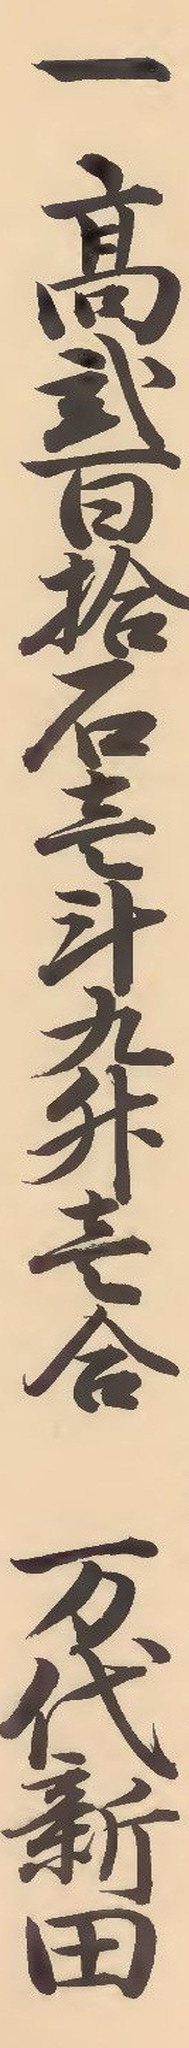一高弐百拾石壱斗九升壱合万代新田
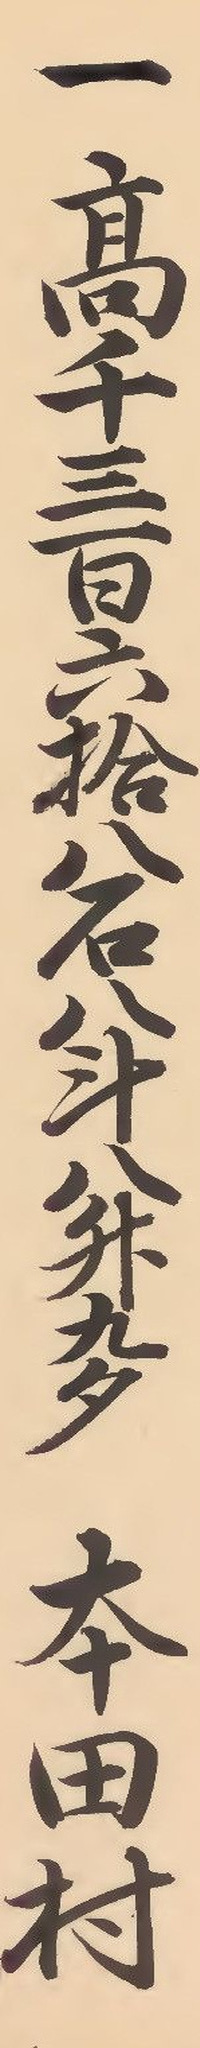一高千三百六拾八石八斗八升九勺本田村

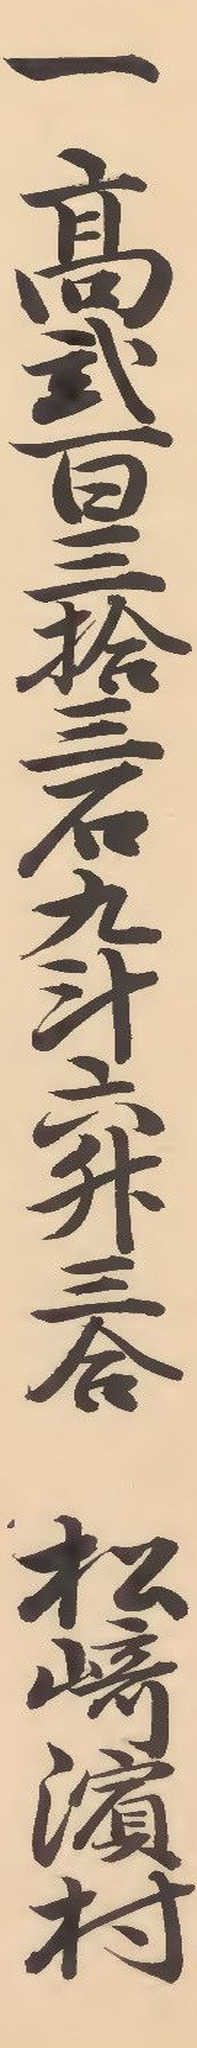一高弐百三拾三石九斗六升三合松崎浜村
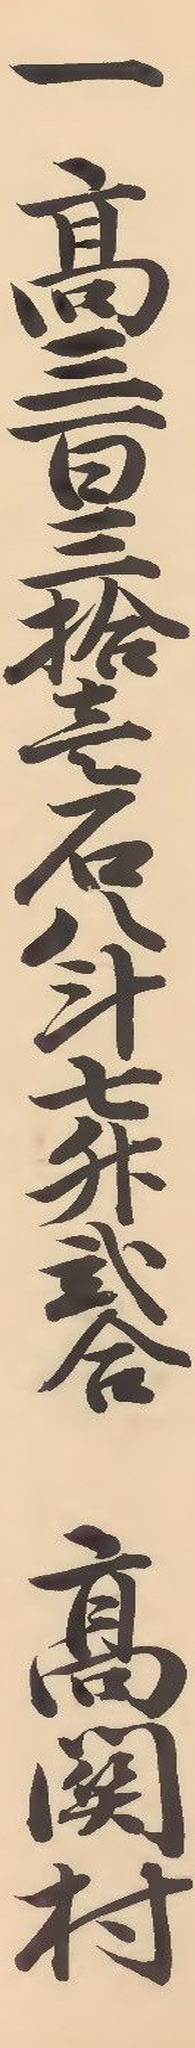一高三百三拾壱石八斗七升弐合高関村
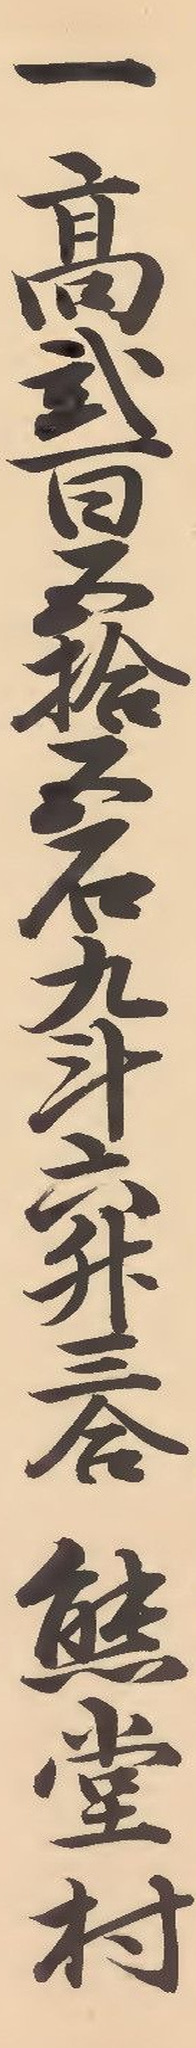一高弐百五拾五石九斗六升三合熊堂村
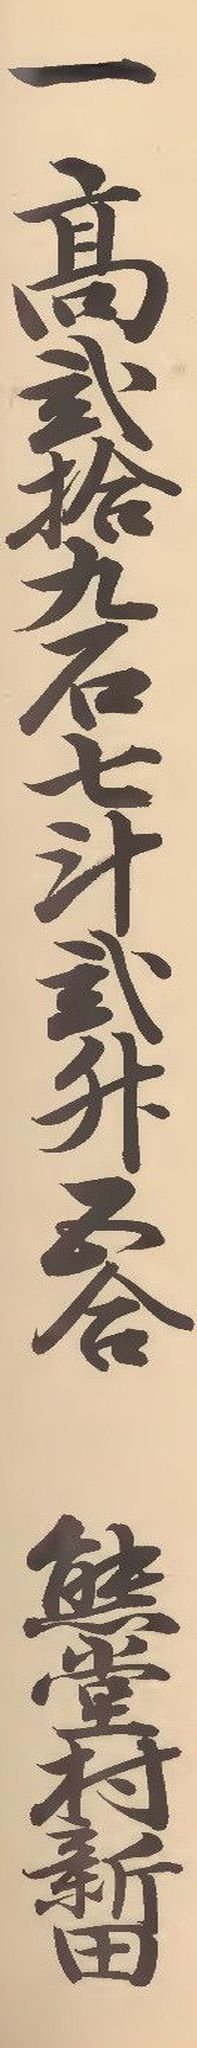一高弐拾九石七斗弐升五合熊堂村新田
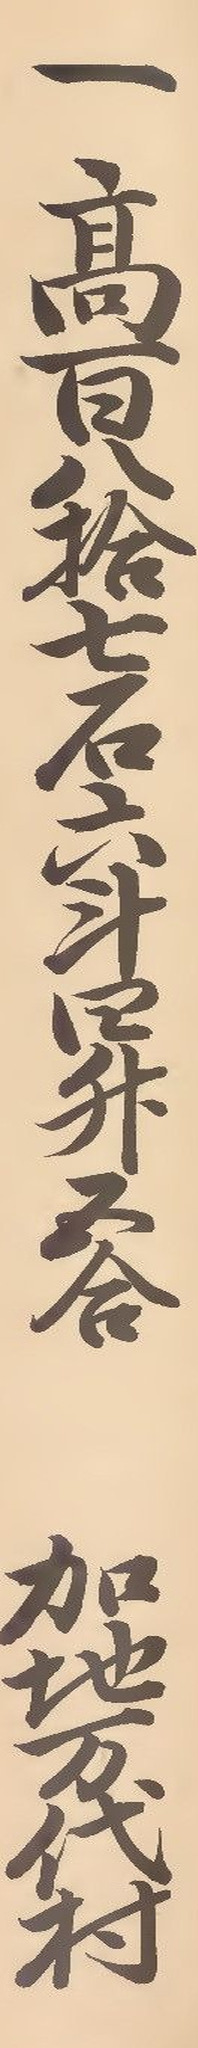一高百八拾七石六斗四升五合加地万代村
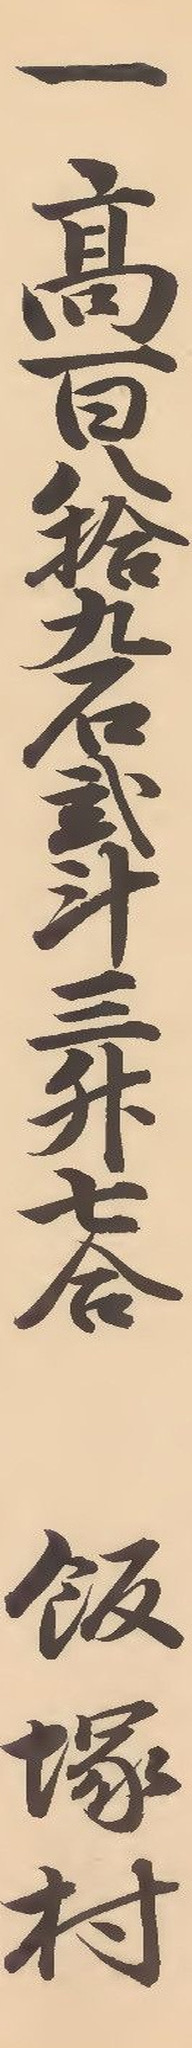一高百八拾九石弐斗三升七合飯塚村
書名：越後国郷帳　下
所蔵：国立公文書館 National Archives of Japan
